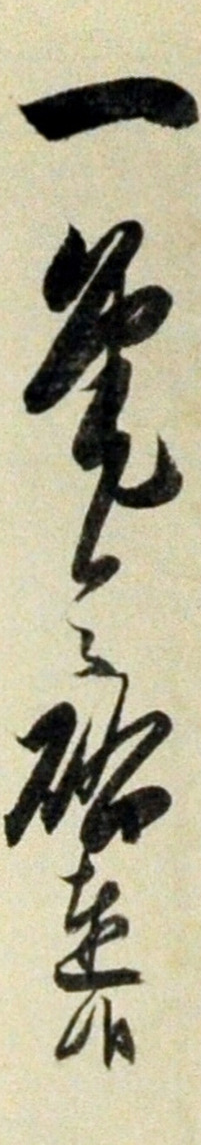一筆令啓達候
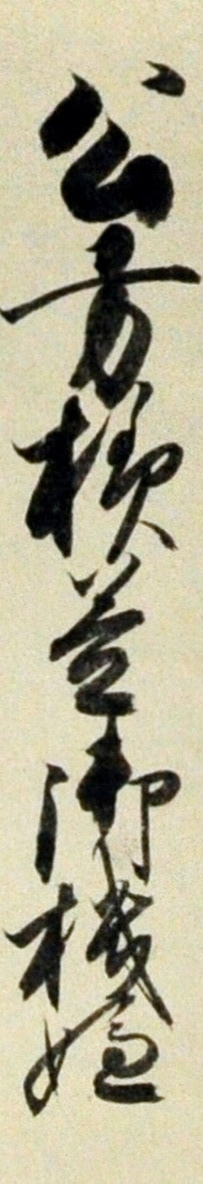公方様益御機嫌
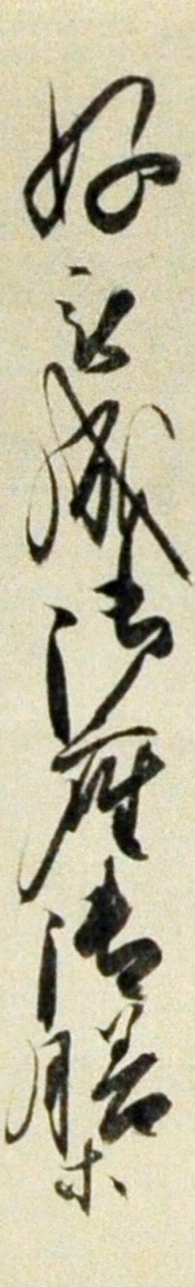好被成御座御膳等
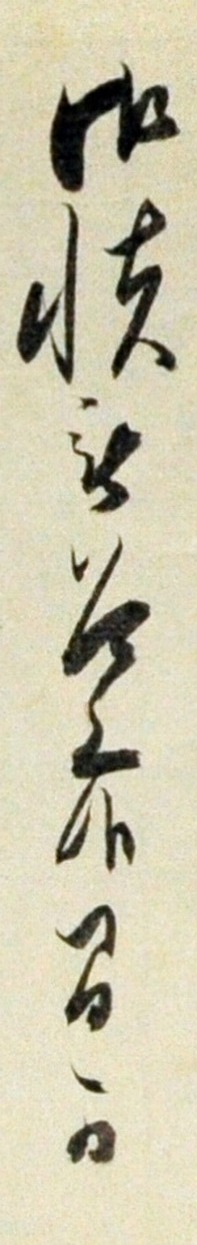御快被召上候間可
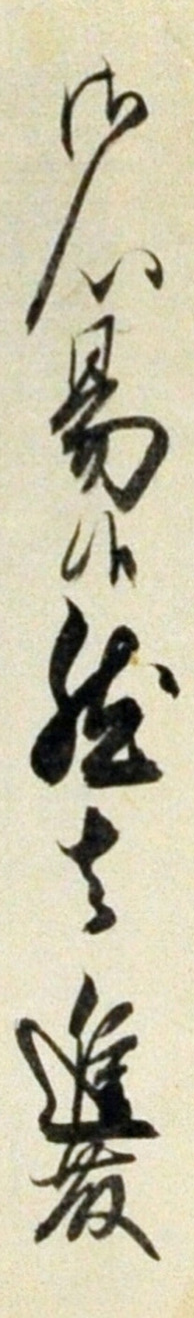御心易候然者進藤
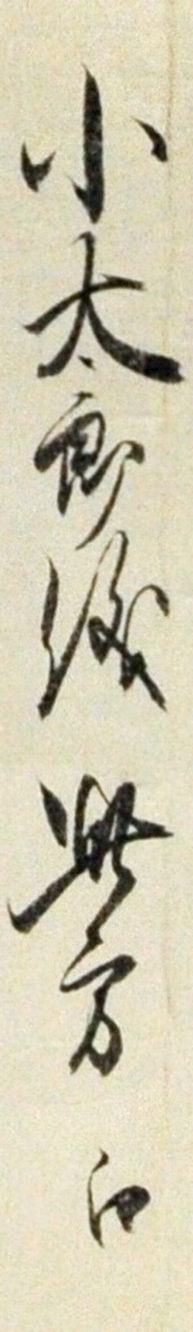小太郎儀此方江
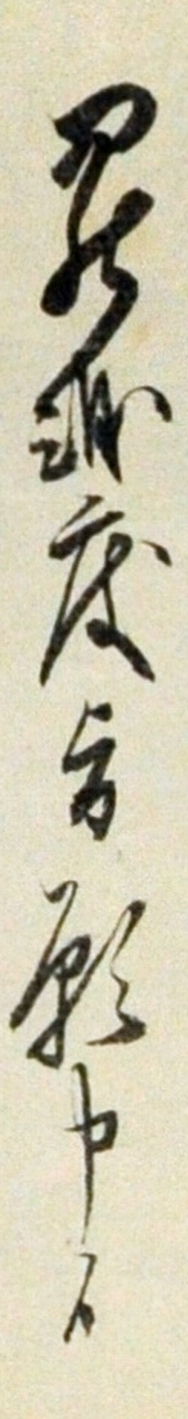罷越度旨願申候
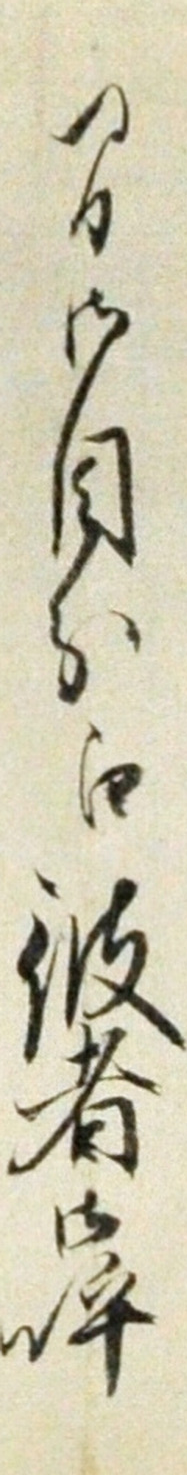間御自分江彼者御呼
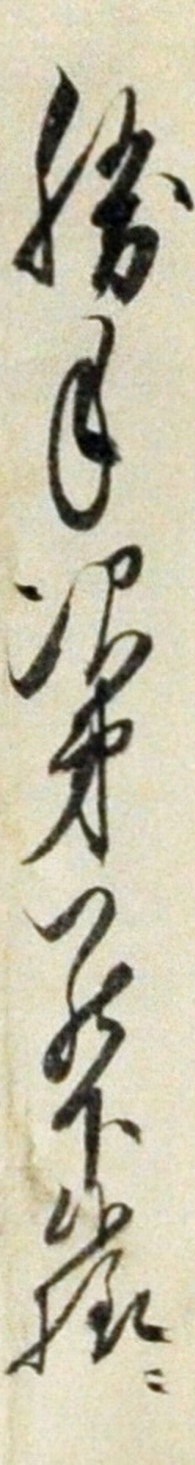勝手次第罷下候様ニ
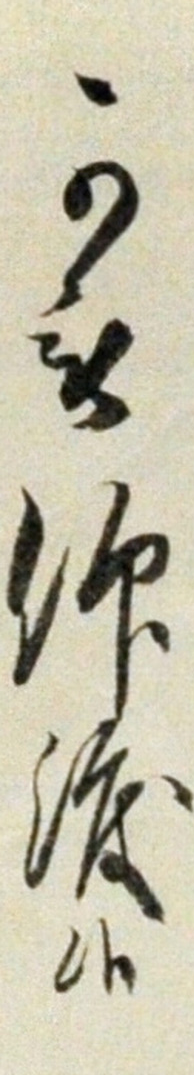可被仰渡候
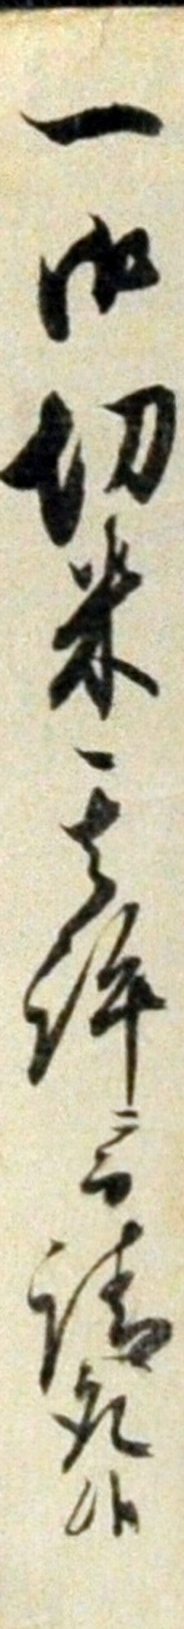一御切米其許ニ而請取候
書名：書状
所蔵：伊那市立高遠町図書館・合同会社AMANE
